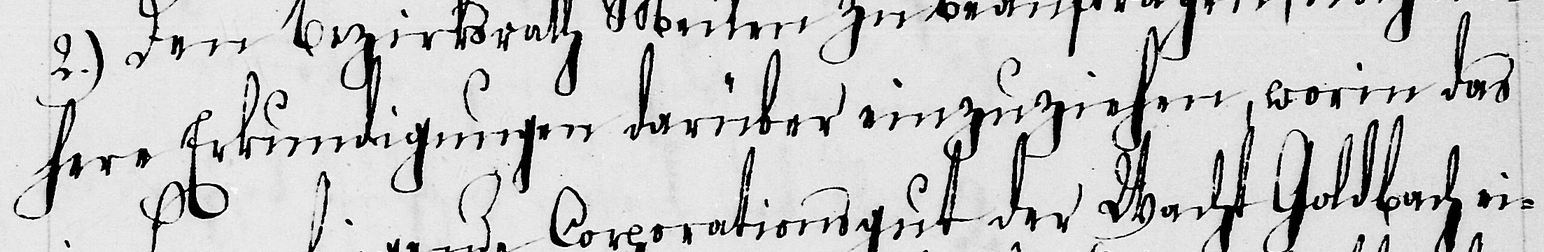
here Erkundigungen darüber einzuziehen, worin das
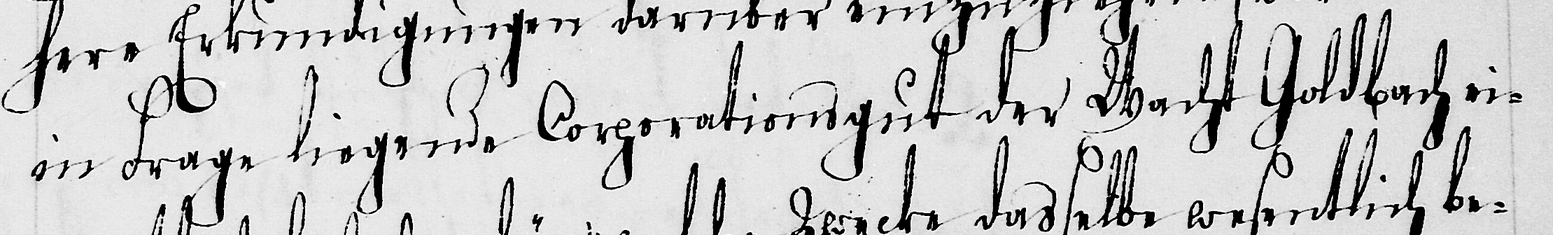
in Frage liegende Corporationsgut der Wacht Goldbach ei¬
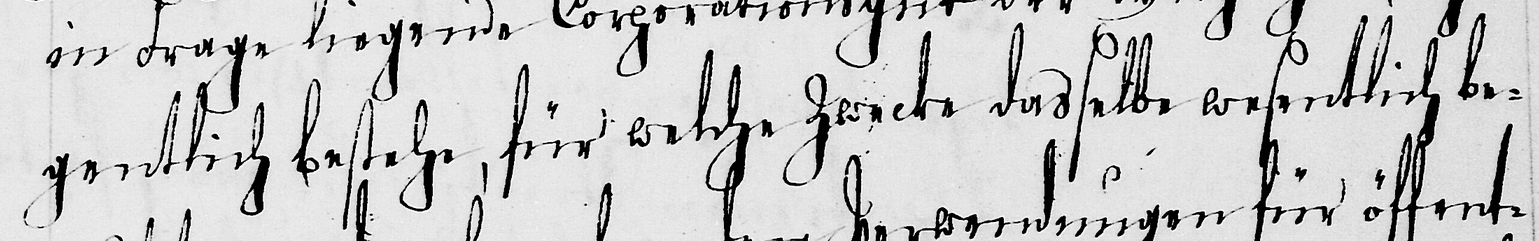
gentlich bestehe, für welche Zwecke dasselbe wesentlich b¬
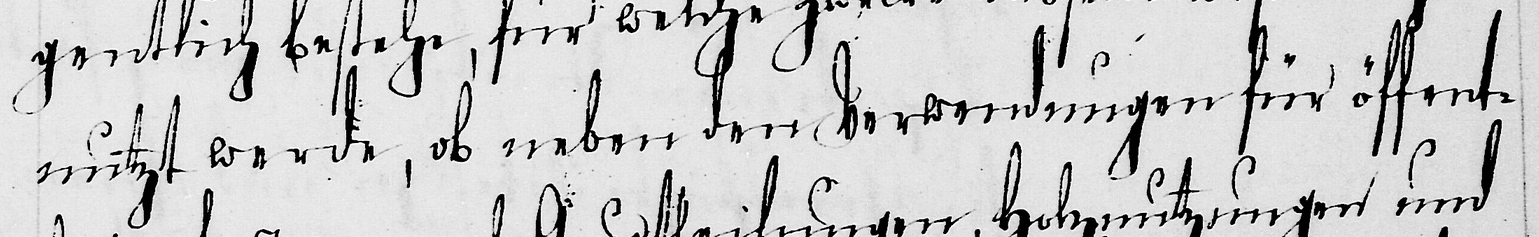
enutzt werde, ob neben den Verwendungen für öffent¬
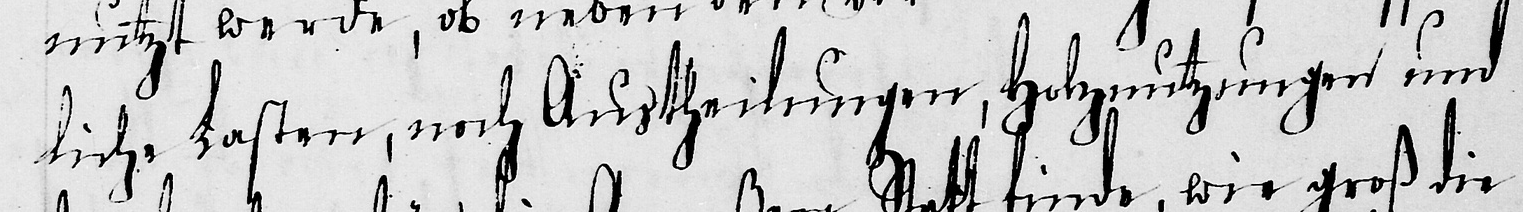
liche Lasten, noch Austheilungen, Holznutzungen und
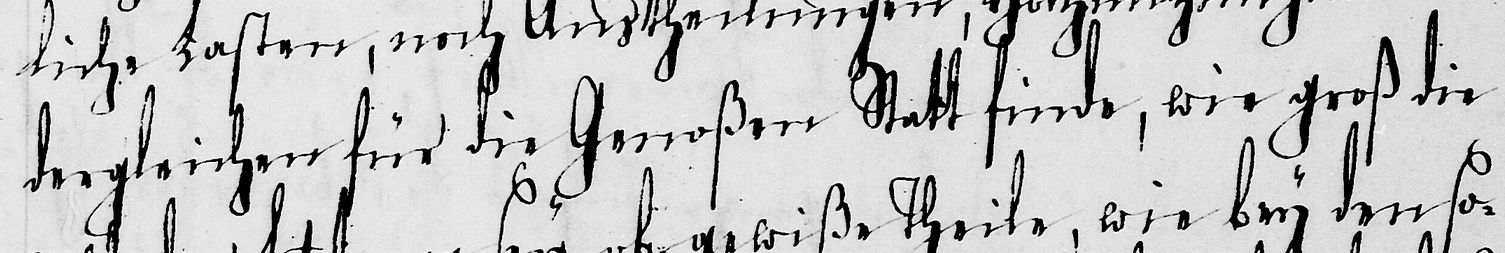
dergleichen für die Genoßen Statt finde, wie groß die
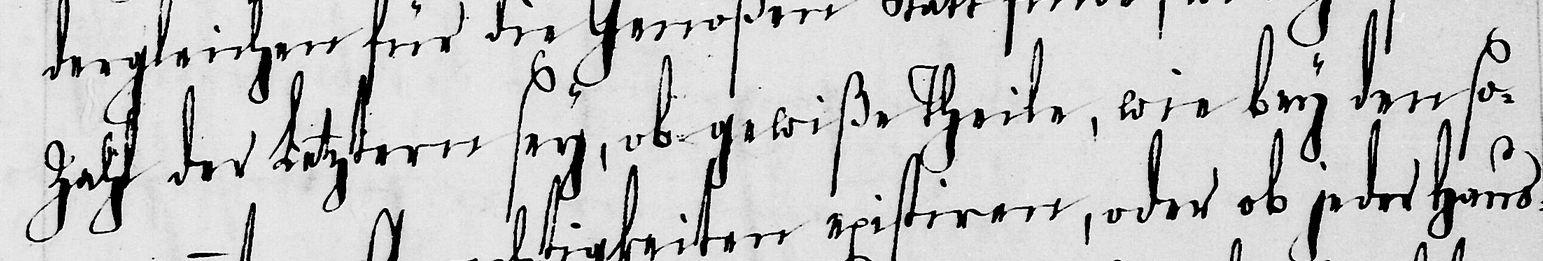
Zahl der Letztern sey, ob gewiße Theile, wie bey den so¬
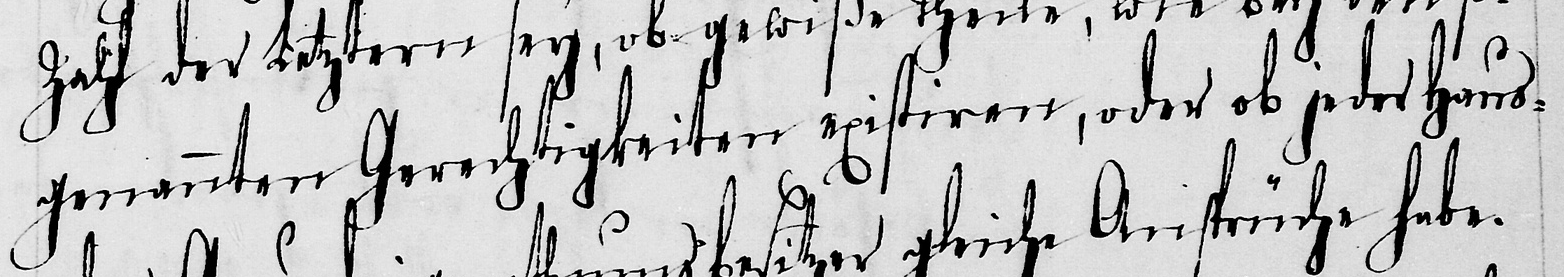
genannten Gerechtigkeiten existiren, oder ob jeder Haus-
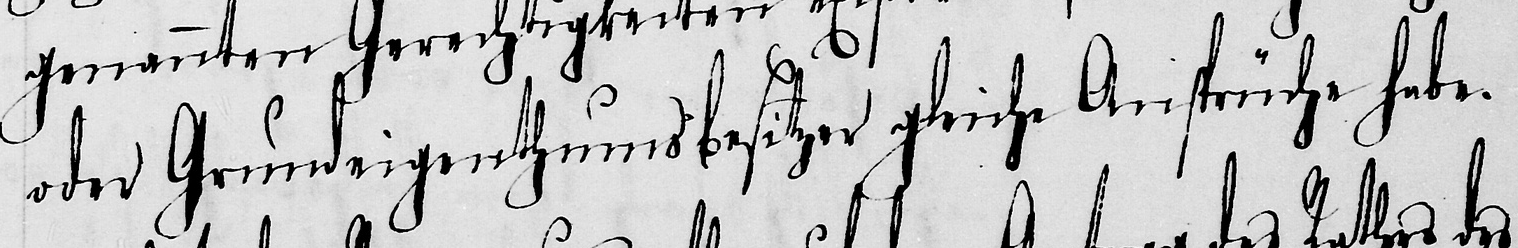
oder Grundeigenthumsbesitzer gleiche Ansprüche habe.
